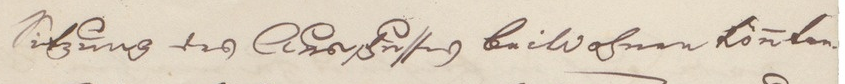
Sitzung des Auschusses beiwohnen könnten.
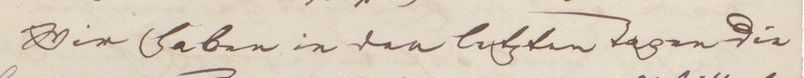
Wir haben in den letzten Tagen die
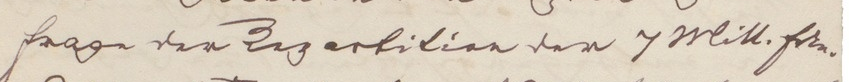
Frage der Repartition der 7 Mill. Frkn.
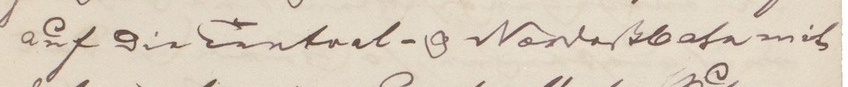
auf die Central- & Nordostbahn mit
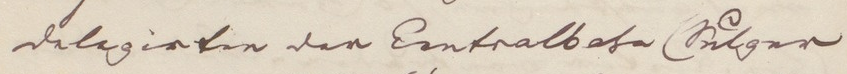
Delegirten der Centralbahn (Sulger
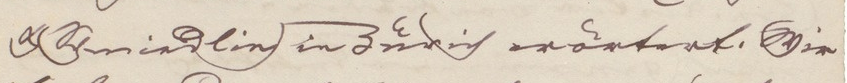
& Schmiedlin) in Zürich erörtert. Wir
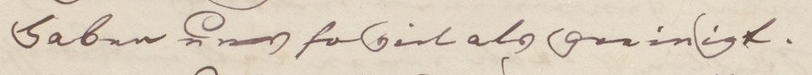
haben uns so viel als geeinigt.
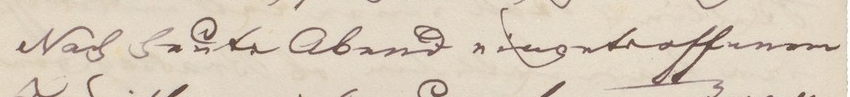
Nach heute Abend eingetroffenem
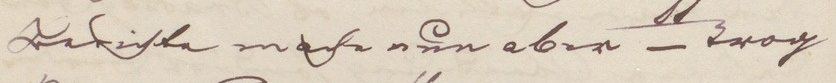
Berichte mache nun aber – Trog
